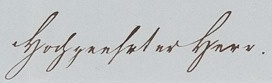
Hochgeehrter Herr.
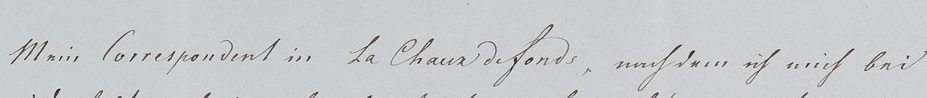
Mein Correspondent in La Chaux de Fonds, nachdem ich mich bei
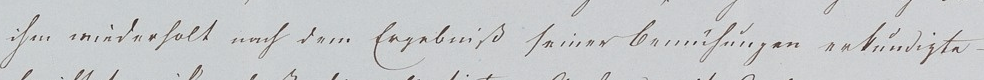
ihm wiederholt nach dem Ergebniß seiner Bemühungen erkundigte –
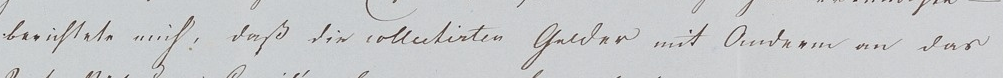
berichtete mich, daß die collectirten Gelder mit Anderm an das
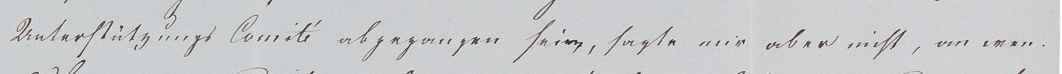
Unterstützungs Comité abgegangen seien, sagte mir aber nicht, an wen.
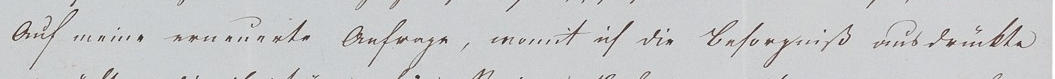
Auf meine erneuerte Anfrage, womit ich die Besorgniß ausdrückte
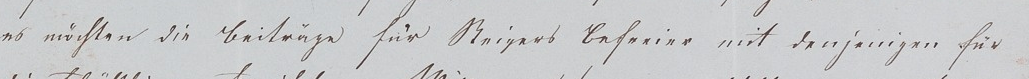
es möchten die Beiträge für Steigers Befreier mit denjenigen für
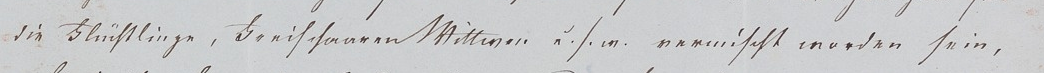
die Flüchtlinge, Freischaaren Wittwen u. s. w. vermischt worden sein,
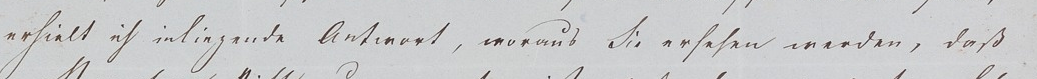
erhielt ich inliegende Antwort, woraus Sie ersehen werden, daß
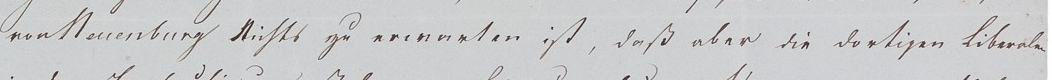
von Neuenburg Nichts zu erwarten ist, daß aber die dortigen Liberalen
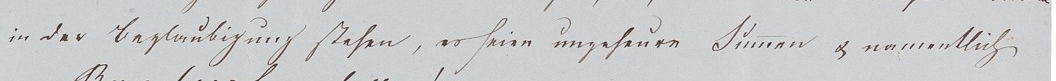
in der Beglaubigung stehen, es seien ungeheure Summen & namentlich
